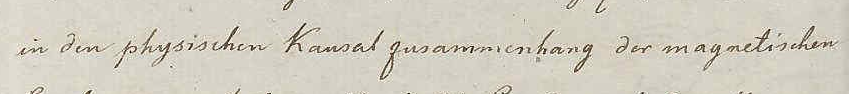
in den physischen Kausalzusammenhang der magnetischen
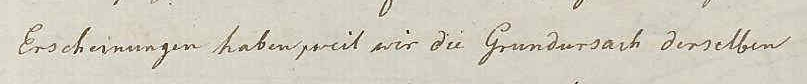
Erscheinungen haben, weil wir die Grundursach derselben
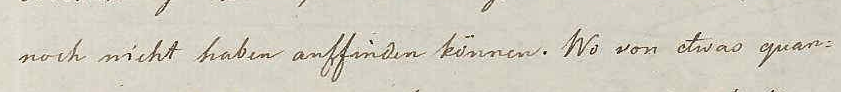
noch nicht haben auffinden können. Wo von etwas quan-
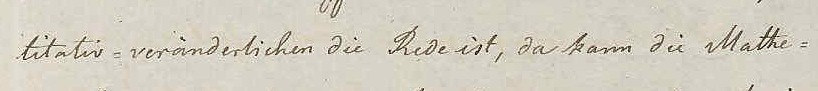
titativ-veränderlichen die Rede ist, da kann die Mathe-
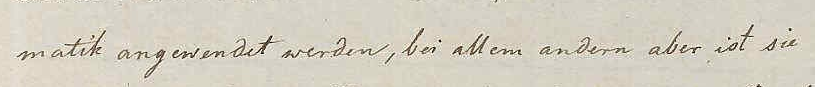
matik angewendet werden, bei allem andern aber ist sie
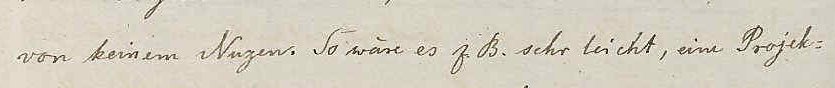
von keinem Nuzen. So wäre es z. B. sehr leicht, eine Projek-
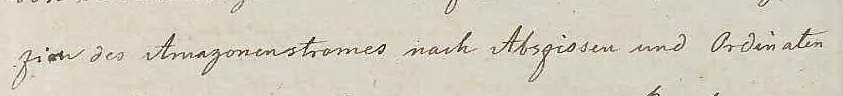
zion des Amazonenstromes nach Abszissen und Ordinaten
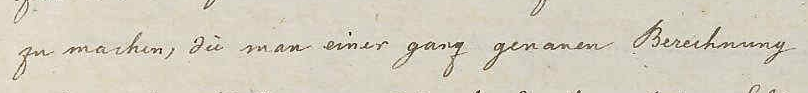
zu machen, die man einer ganz genauen Berechnung
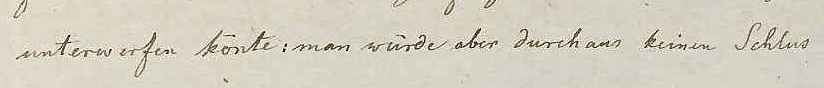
unterwerfen könte: man würde aber durchaus keinen Schlus
